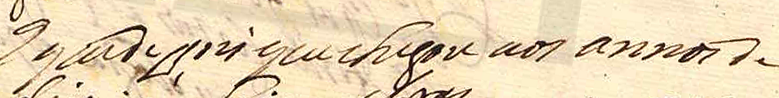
E que depois que chegou aos annos de
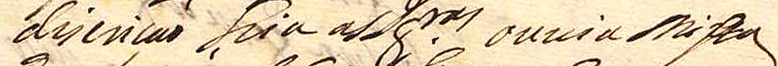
discriçaõ hia as Ig.ras ouuia Missa
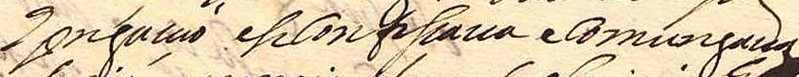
E pregaçaõ e se confessaua e comungaua
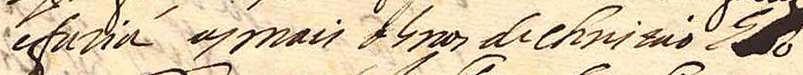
e fazia as mais obras de christaõ E o
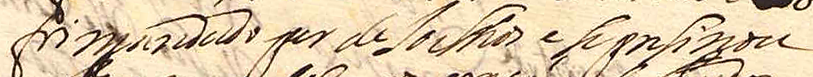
foi mandado per de Ioelhos e se presinou
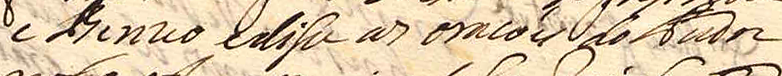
e Benzeo e disse as oraçoẽs do Pader
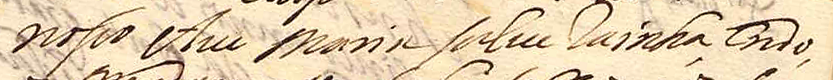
nosso Aue maria salue Rainha, Credo,
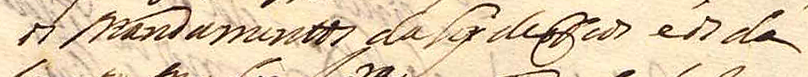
os mandamentos da ley de Deos e os da
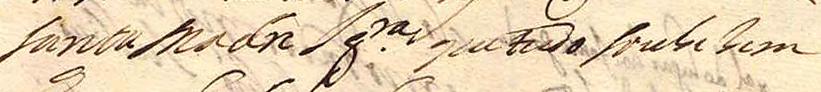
santa Madre Ig.ra que tudo soube bem
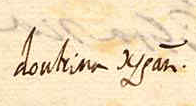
doutrina xpãn.
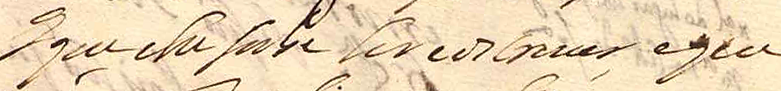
E que elle sabe ler e escreuer e que
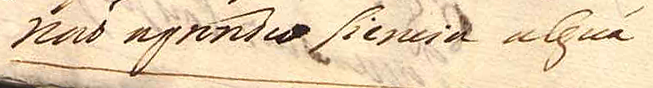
naõ aprendeo siencia alguã
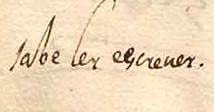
sabe ler e escreuer.
